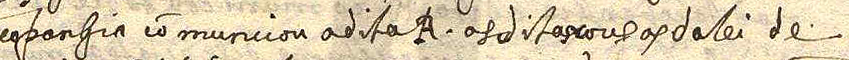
c̄opanhia cōmunicou a dita R. as ditas cousas da lei de
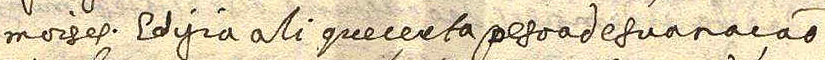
moises. E dizia ali que çerta pesoa de sua naçaõ
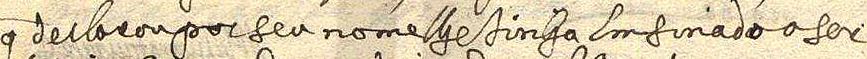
q̄ declarou por seu nome lhe tinha Emsinado a ser
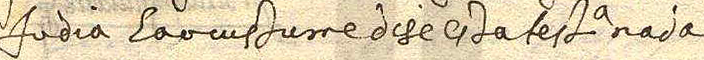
Judia E ao custume dise esta testa nada
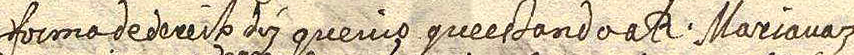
forma de dereito diz que uio que estando a R. Maria uaz
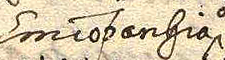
Em c̄opanhia
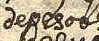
de pesoas
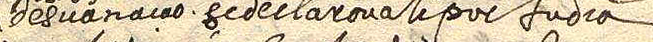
de sua naçaõ. se declarou ali por Iudia
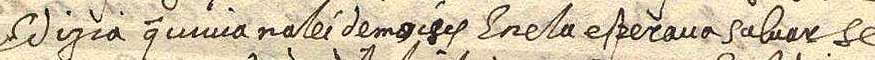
E dizia q̄ uiuia na lei de moises E nela esperaua saluarse
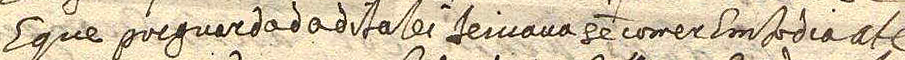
E que por guarda da dita lei Ieiuaua sē comer Em to dia ate
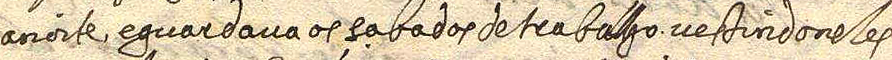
a noite, e guardaua os sabados de trabalho uestindo neles
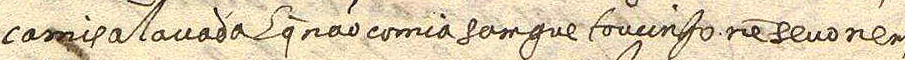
camisa lauada E q̄ naõ comia samgue toucinho nē seuo nem
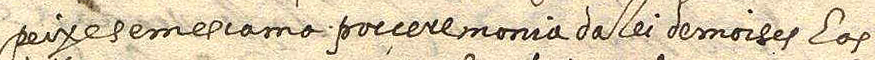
peixe sem escama. por çeremonia da lei de moises E as
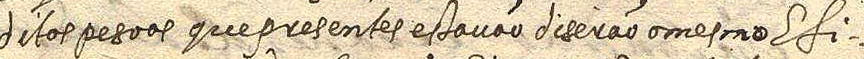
ditas pesoas que presentes estauaõ diseraõ o mesmo E fi
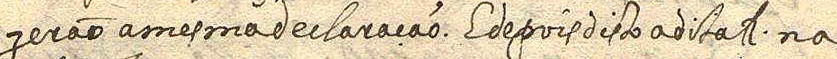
zeraõ a mesma declaraçaõ. E depois disto a dita R. na
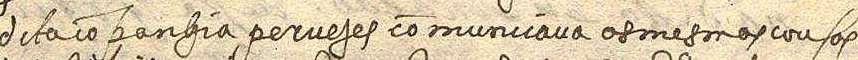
dita c̄opanhia per uezes cōmunicaua as mesmas cousas
